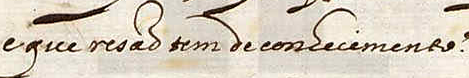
e que resaõ tem de conhecimento?
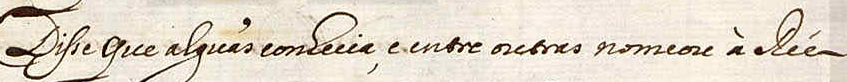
Disse que alguās conhecia, e entre outras nomeou à Rée
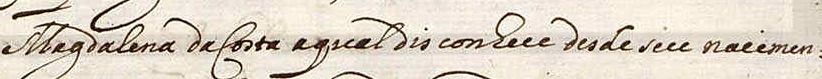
Magdalena da Costa a qual dis conhece desde seu nacimen
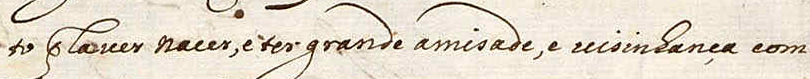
to pla ver nacer, e ter grande amisade, e uisinhança com
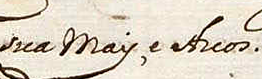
sua may, e Auos.
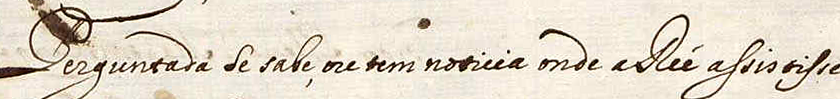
Perguntada se sabe, ou tem noticia onde a Reé assistisse
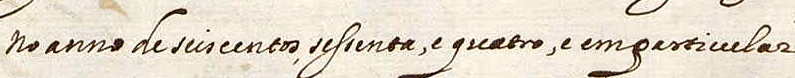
no anno de seiscentos, e sessenta, e quatro, e em particular
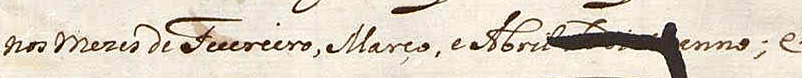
nos mezes de Feuereiro, Março, e Abril _ enno; e
